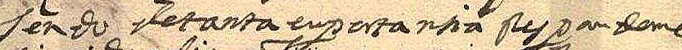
sendo de tanta emportansia Respondeme
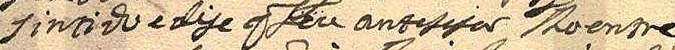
sintido e dise q̄ seu antesesor lho entre
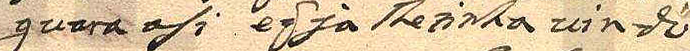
guara asi e q̄ ja lhe tinha uindo
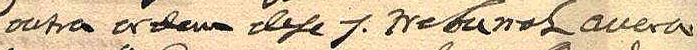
outra ordem dese s. trebunal auera
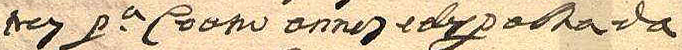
tres p.a Coatro annos e despachada
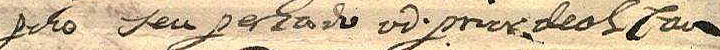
pelo seu perlado o d. prior de aLCan
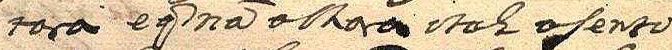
tara e q̄ naõ achava o tal asento
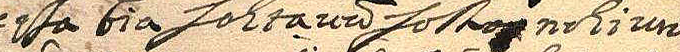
e q̄ sabia faltauaõ folhas no liuro
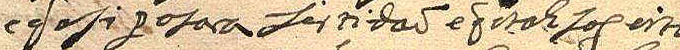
e q̄ asi pasara sertidaõ e q̄ o tal sogeito
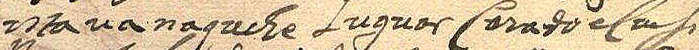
estaua naquele Luguar Cazado e Con fi
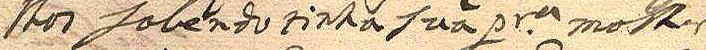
lhos sabendo tinha sua pr.a molher
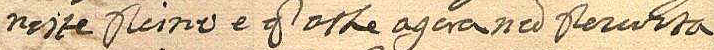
neste Reino e q̄ athe agora naõ Rezulta
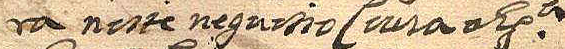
ra neste neguosio Couza alg.a
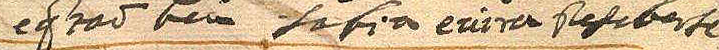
e q̄ taõbem sabia e uira Reseberse
